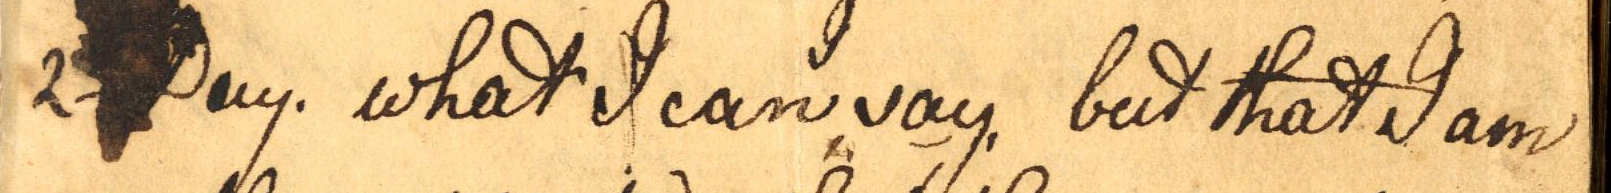2[__] Day. what I can ^ say, but that I am
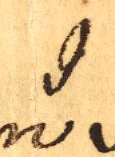I
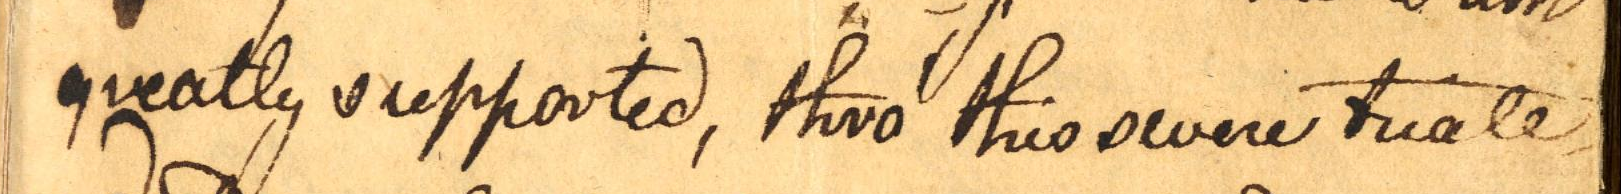greatly supported, thro' this severe triall
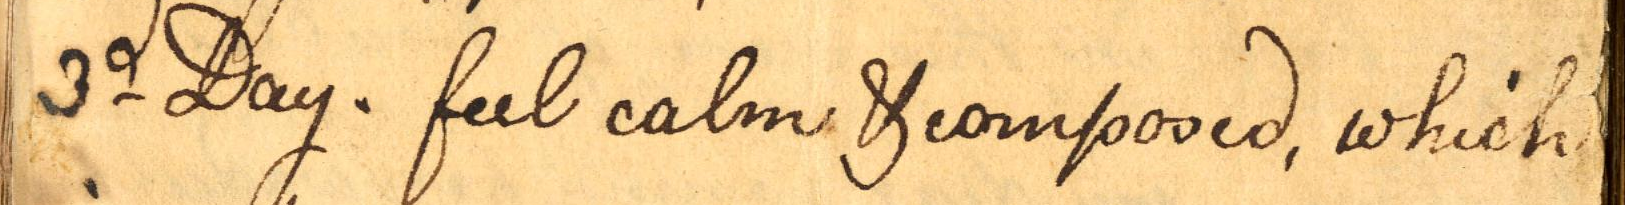3^d Day. feel calm & composed, which
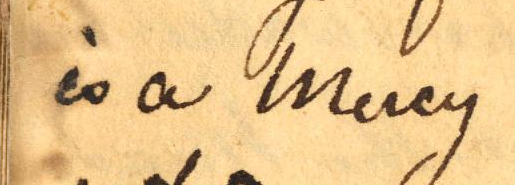is a mercy
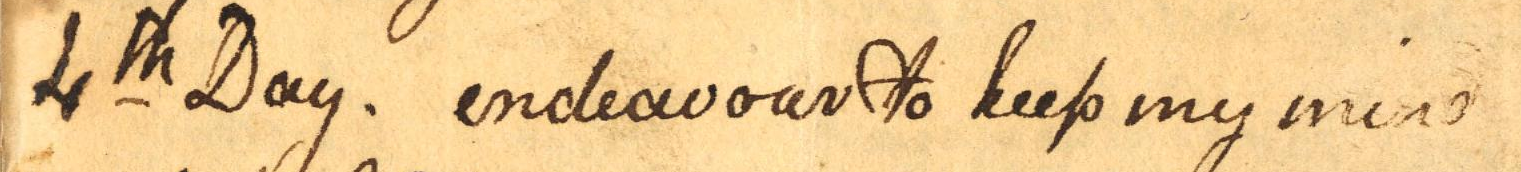4^th Day. endeavour to keep my mind
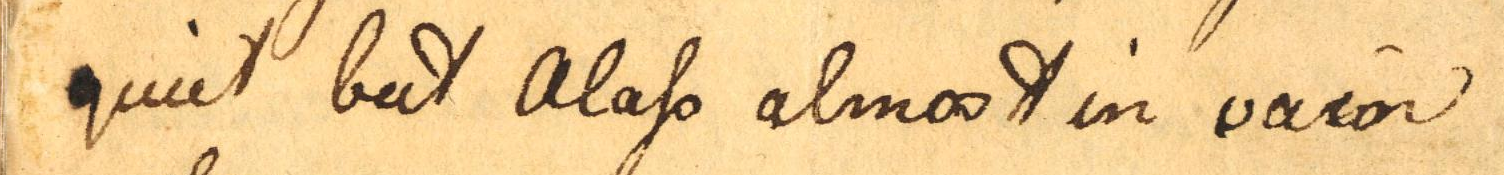quiet but Alass almost in vain
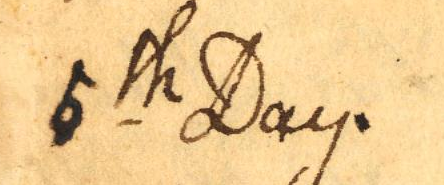5^th Day.
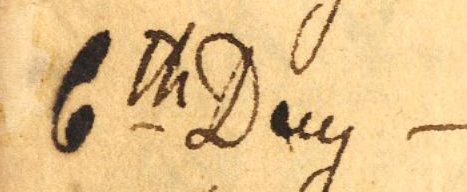6^th Day
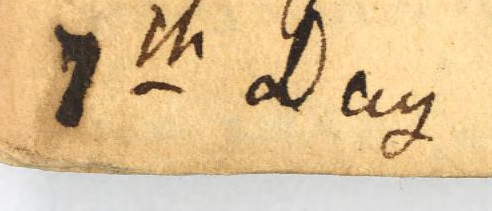7^th Day
